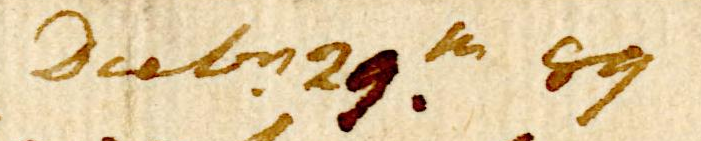Decb^r 29^th. 89
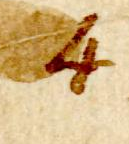4
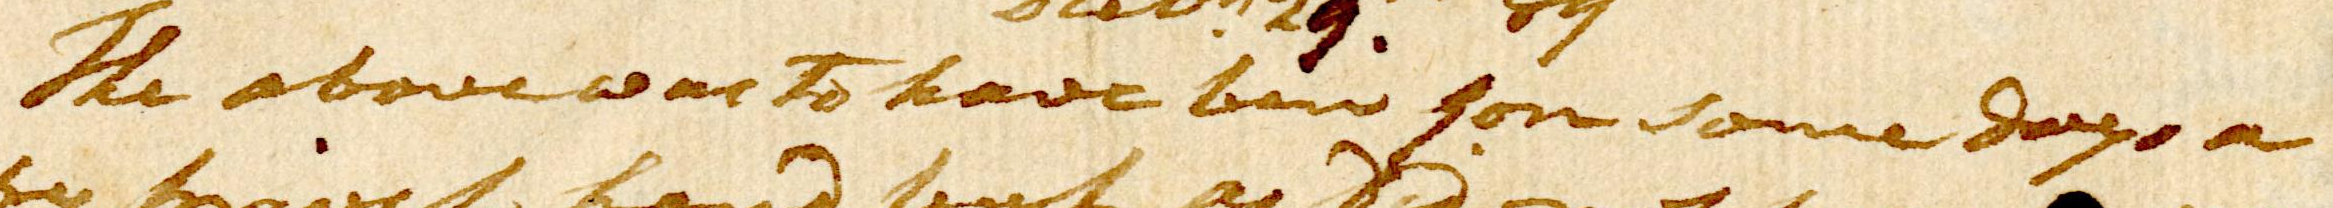The above was to have been gon some days a
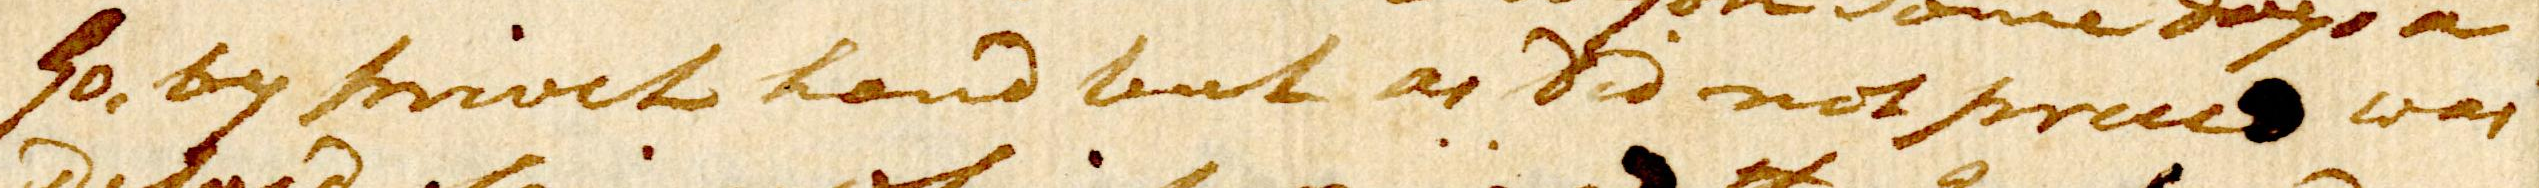Go, by privet hand but as did not procced was
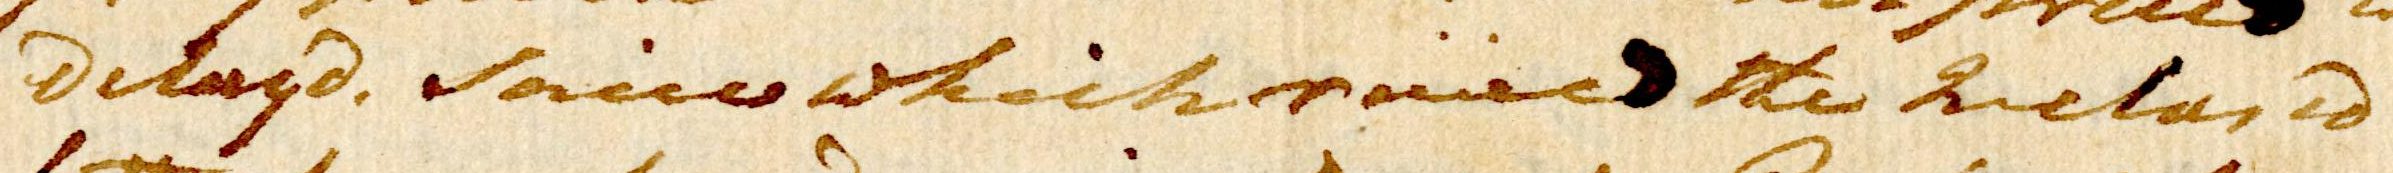delayd. Since which received the Inclosed
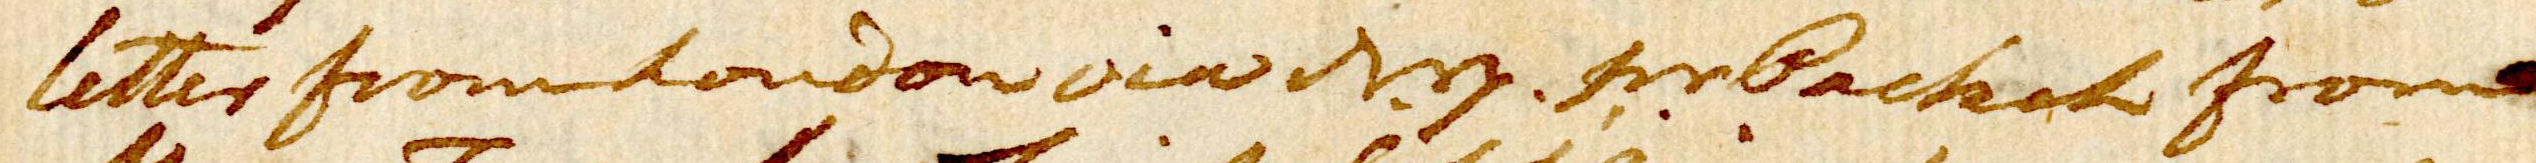letter from London via N.Y p^r. Packet from
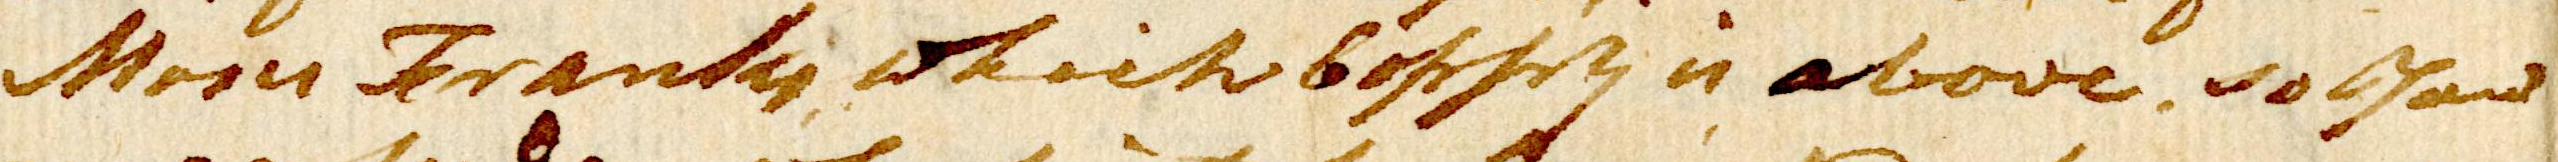Moses Franks which Coppy is above. So you
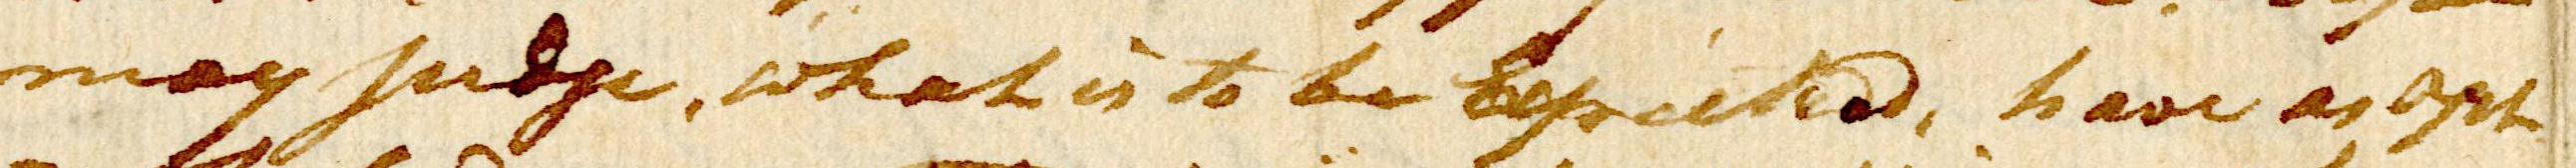may judge, what is to be Expected, have as yet
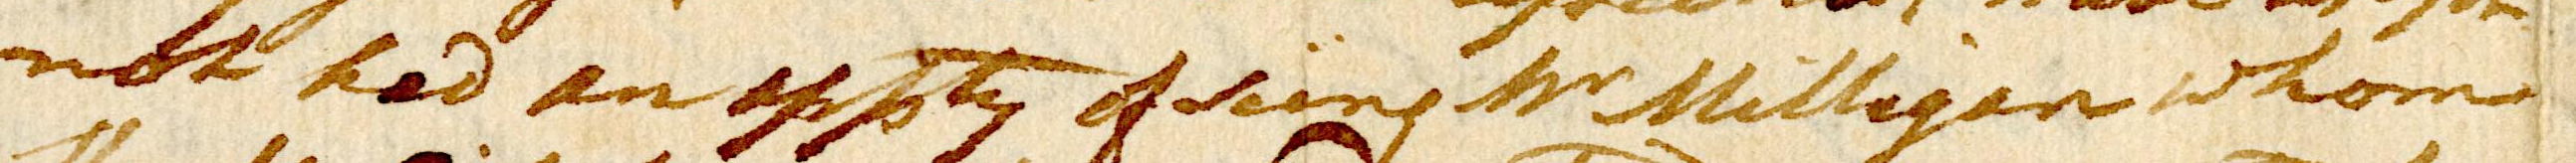not had an opp^ty of seing M^r Milligan whom
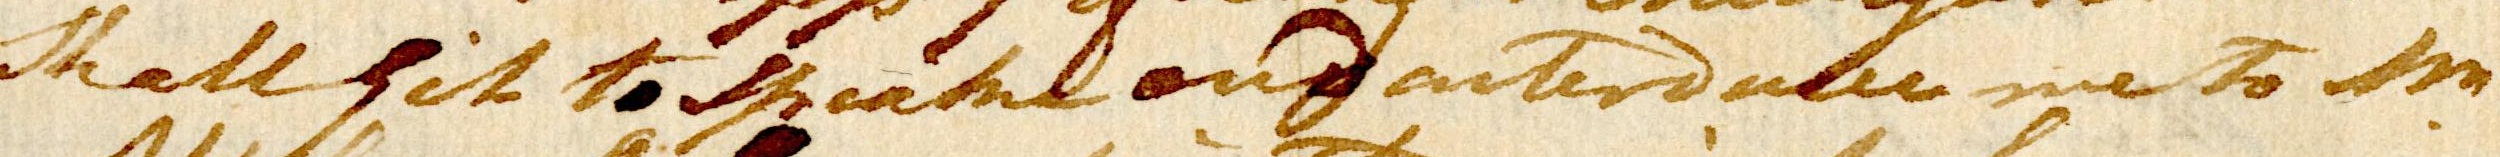shall git to speake and anterduce use me to M^r
